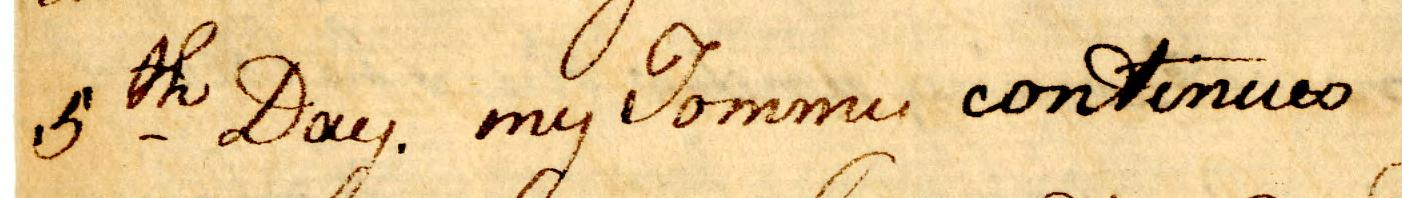5^th Day. my Tommy continues
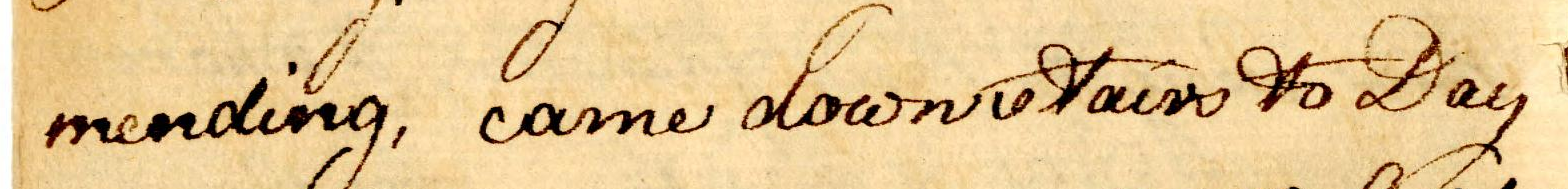mending, came downstairs to Day
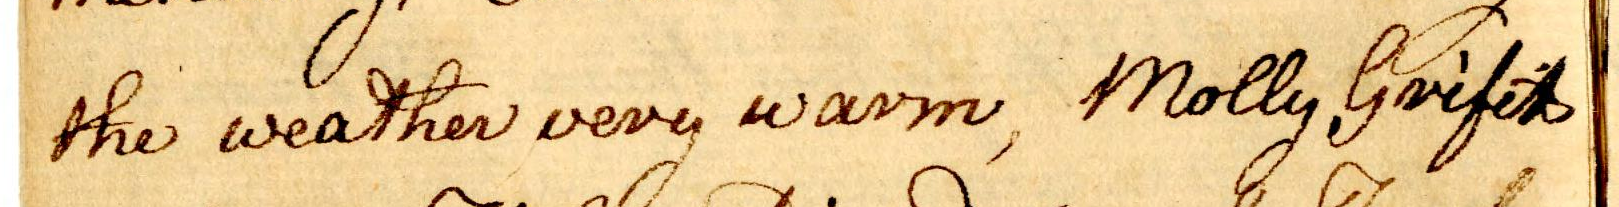the weather very warm, Molly Grifith
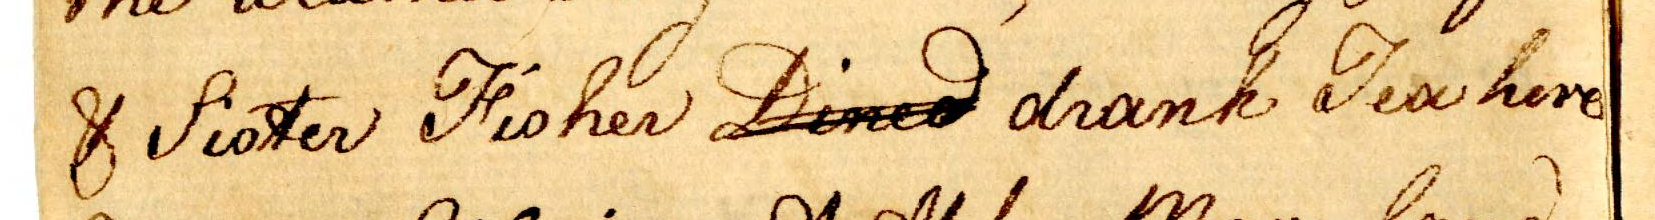& Sister Fisher [Dined] drank Tea here
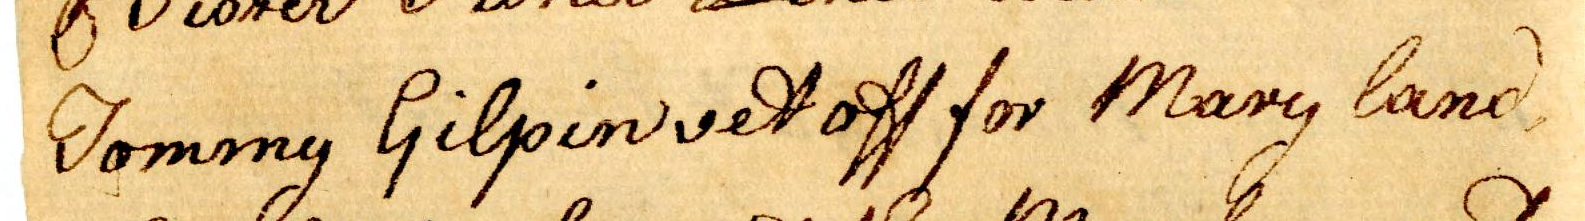Tommy Gilpin set off for Mary land
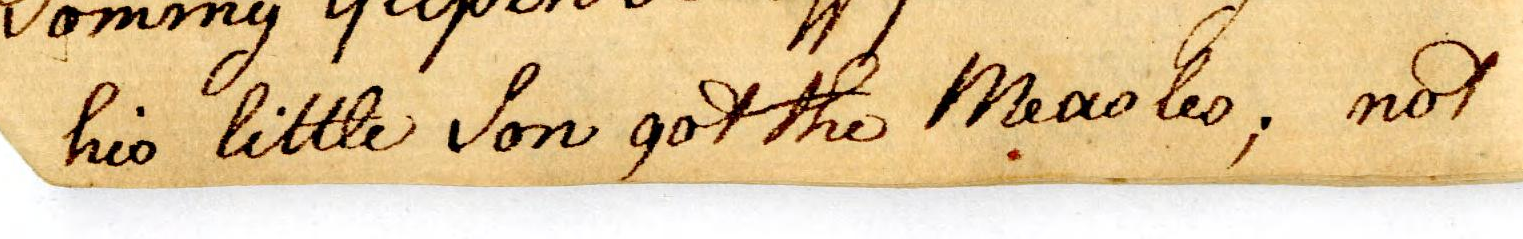his little Son got the Measles; not
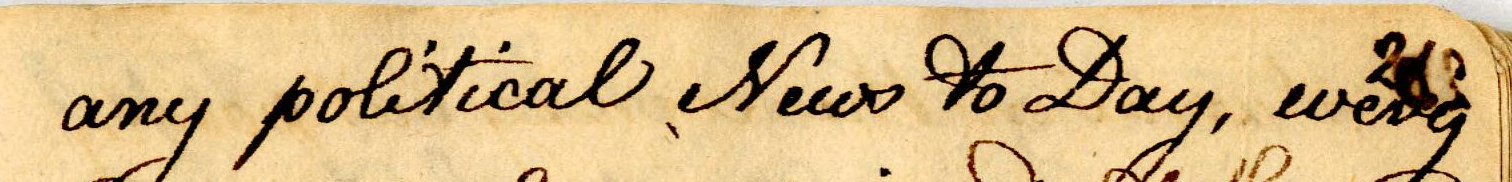any political News to Day, every
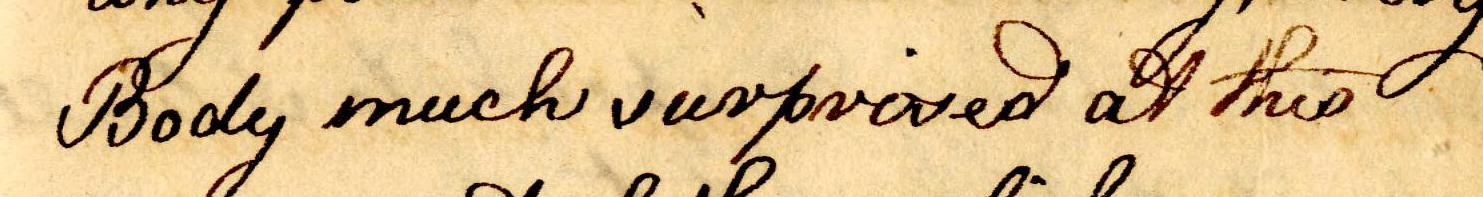Body much surprised at this
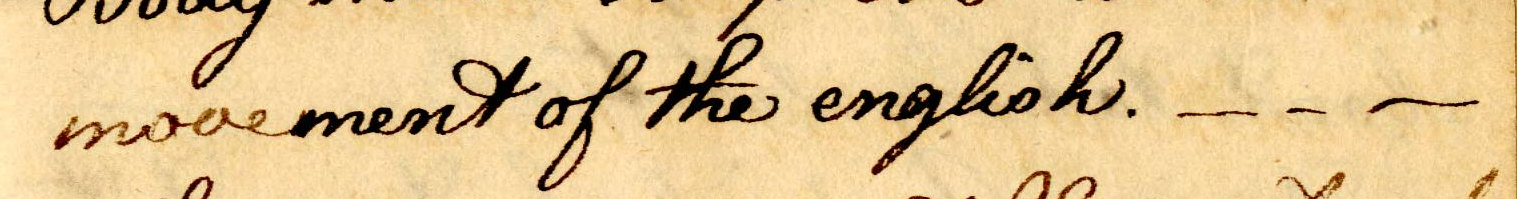movement of the english.---
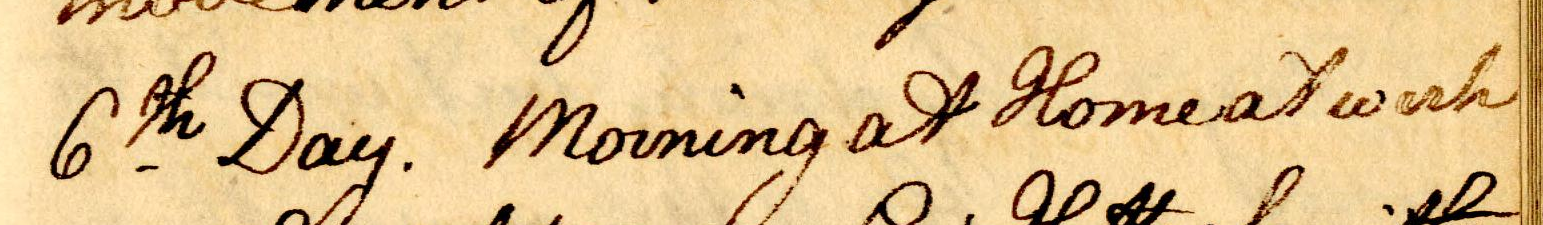6^th Day. Morning at Home at work
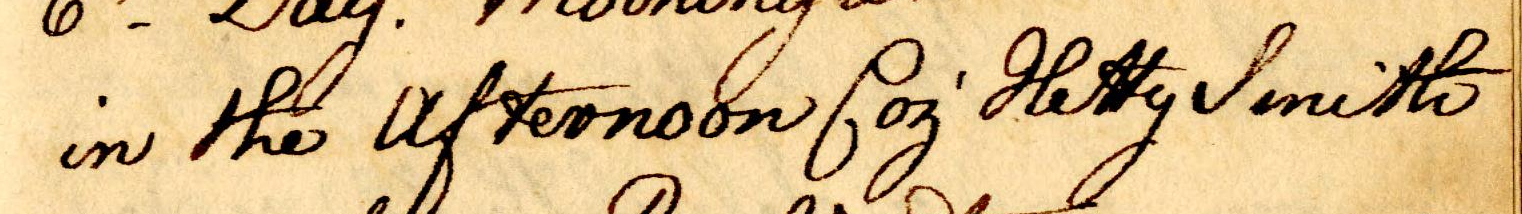in the Afternoon Coz' Hetty Smith
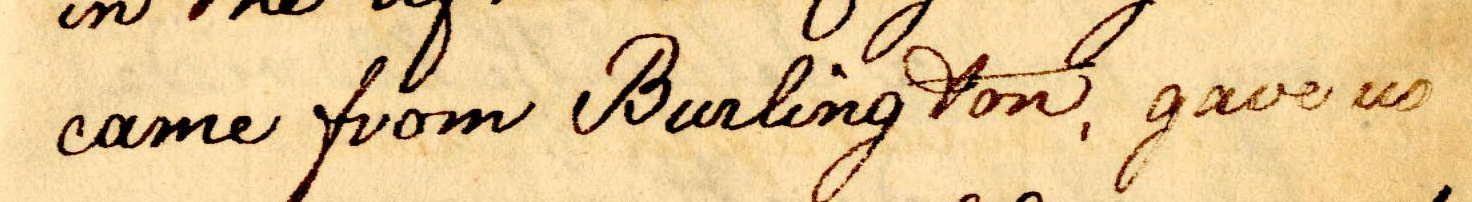came from Burlington, gave us
